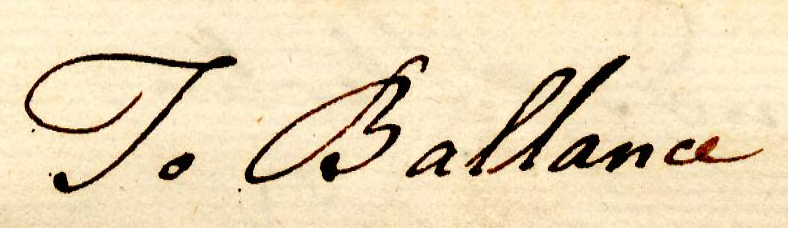To Ballance
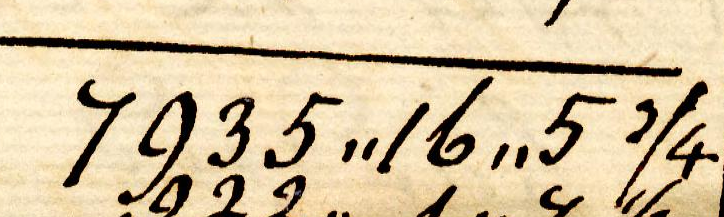7935.. 16.. 5 3/4
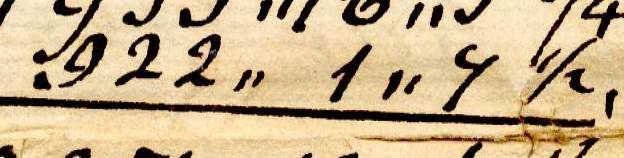922.. 1.. 7 1/2
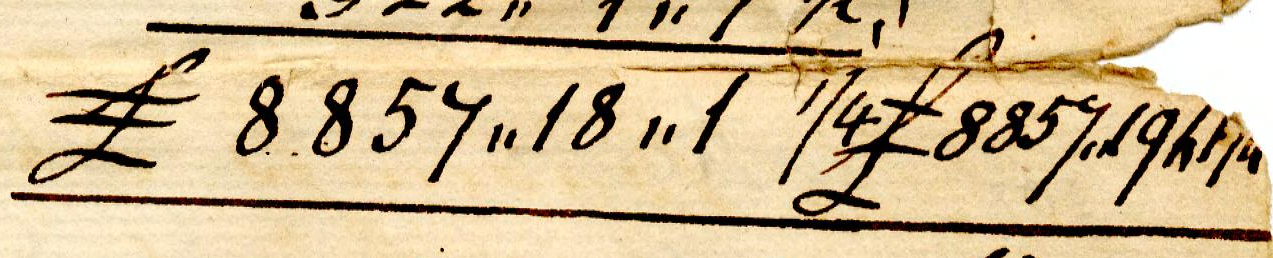£ 8857.. 18.. 1 1/4 £8857.. 19. 1/4
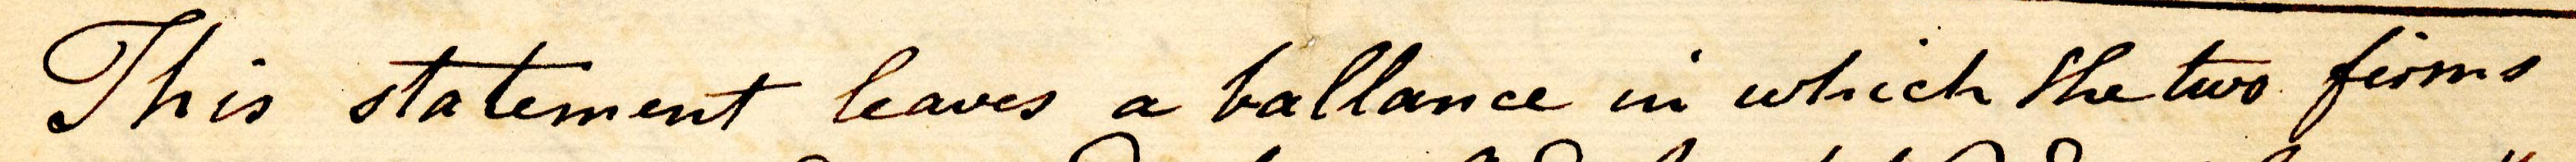This statement leaves a ballance in which the two firms
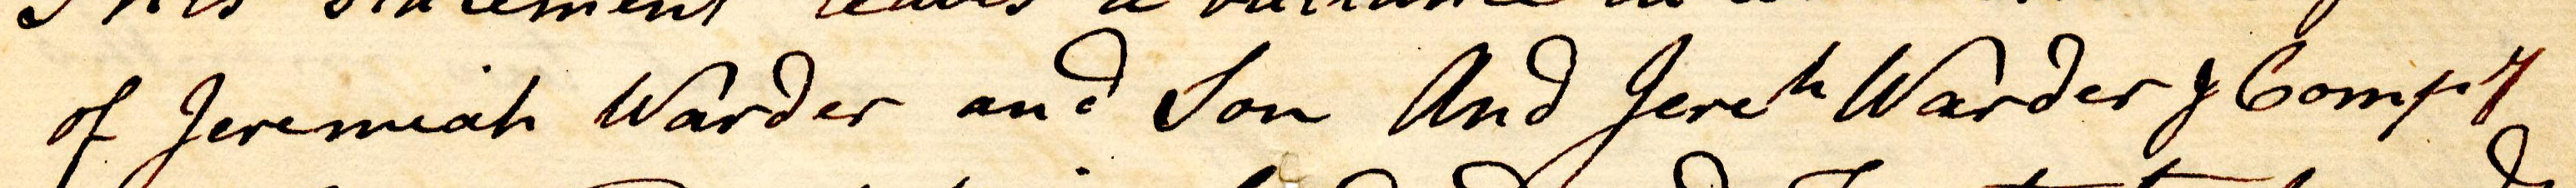of Jeremiah Warder and Son And Jere^h Warder & Comp^y
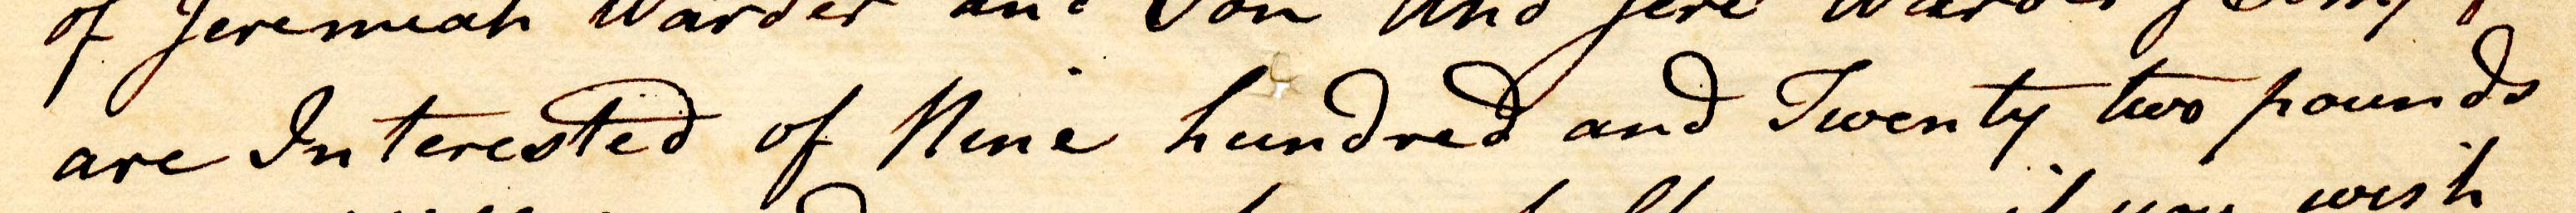are Interested of Nine hundred and Twenty two pounds
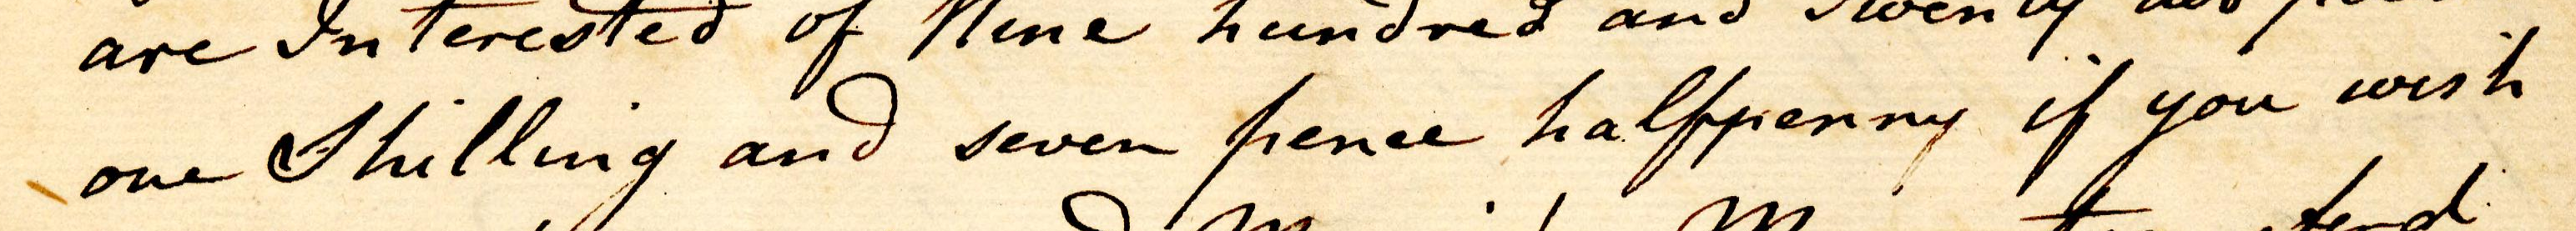one Shilling and seven pence halfpenny if you wish
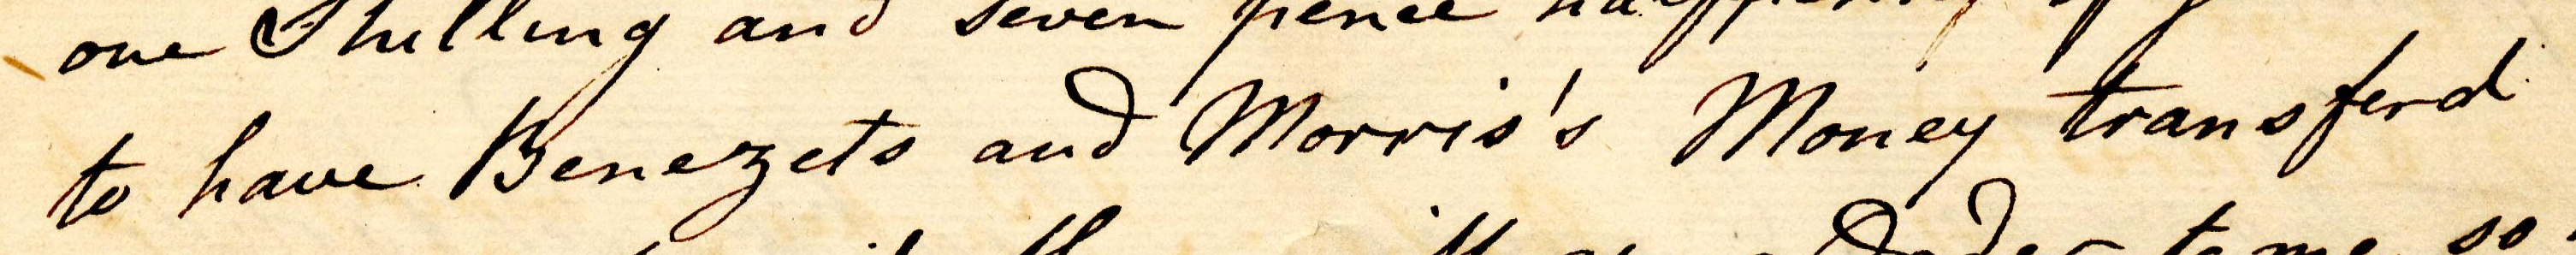to have Benezets and Morris's Money transferd
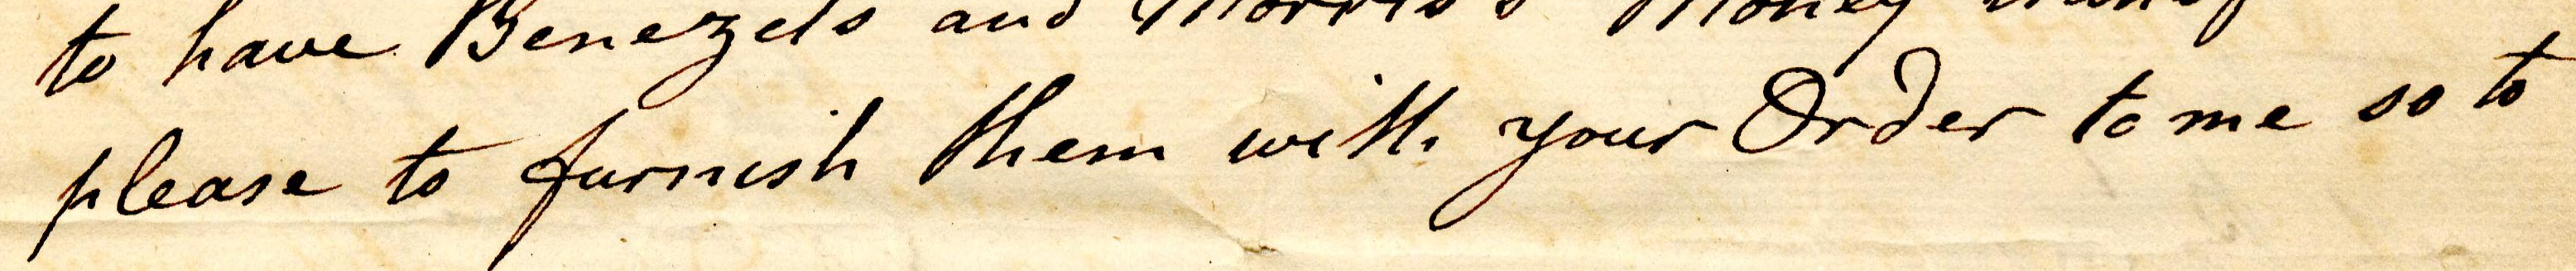please to furnish them with your Order to me so to
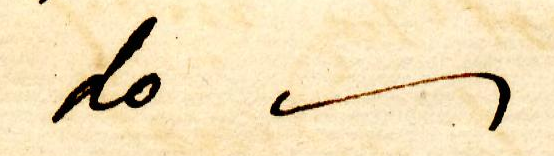do.
